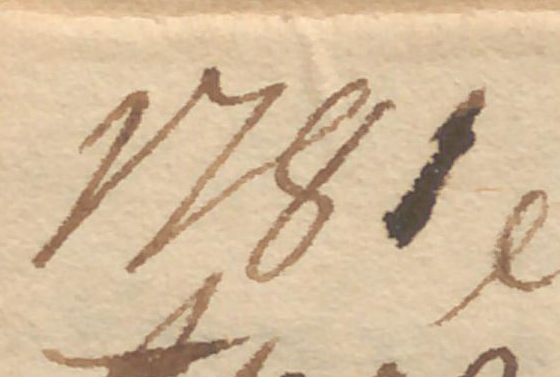1781
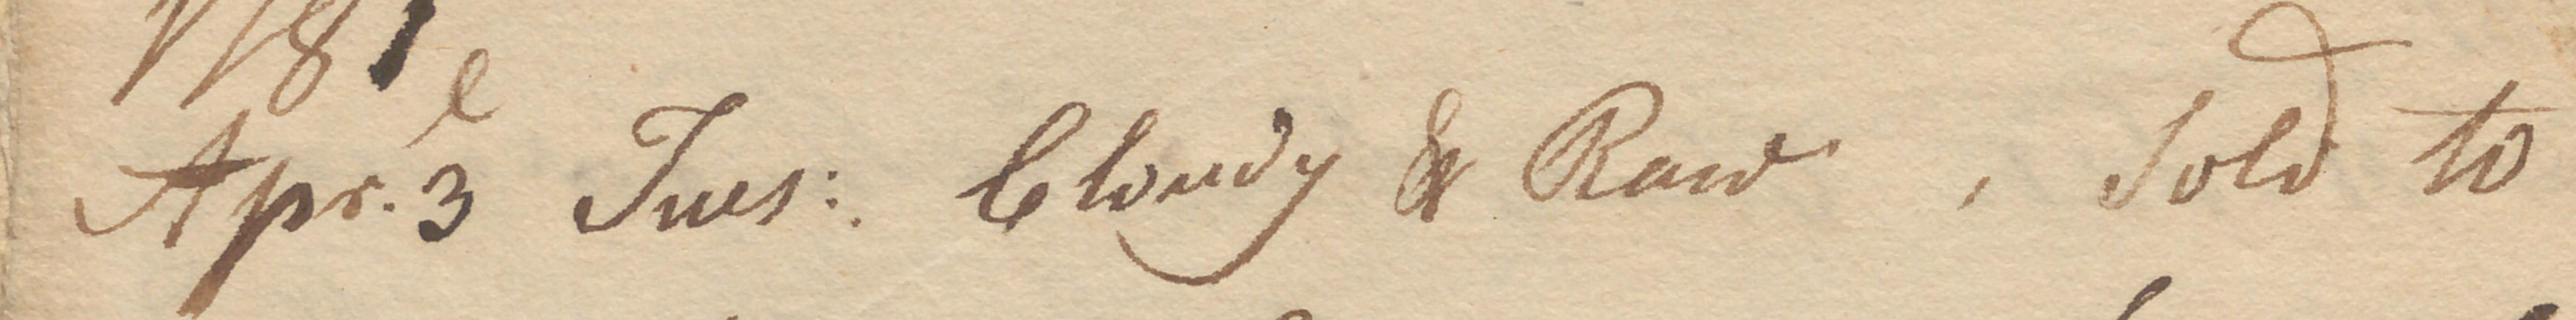Apr^l. 3 Tues: Cloudy & Raw, sold to
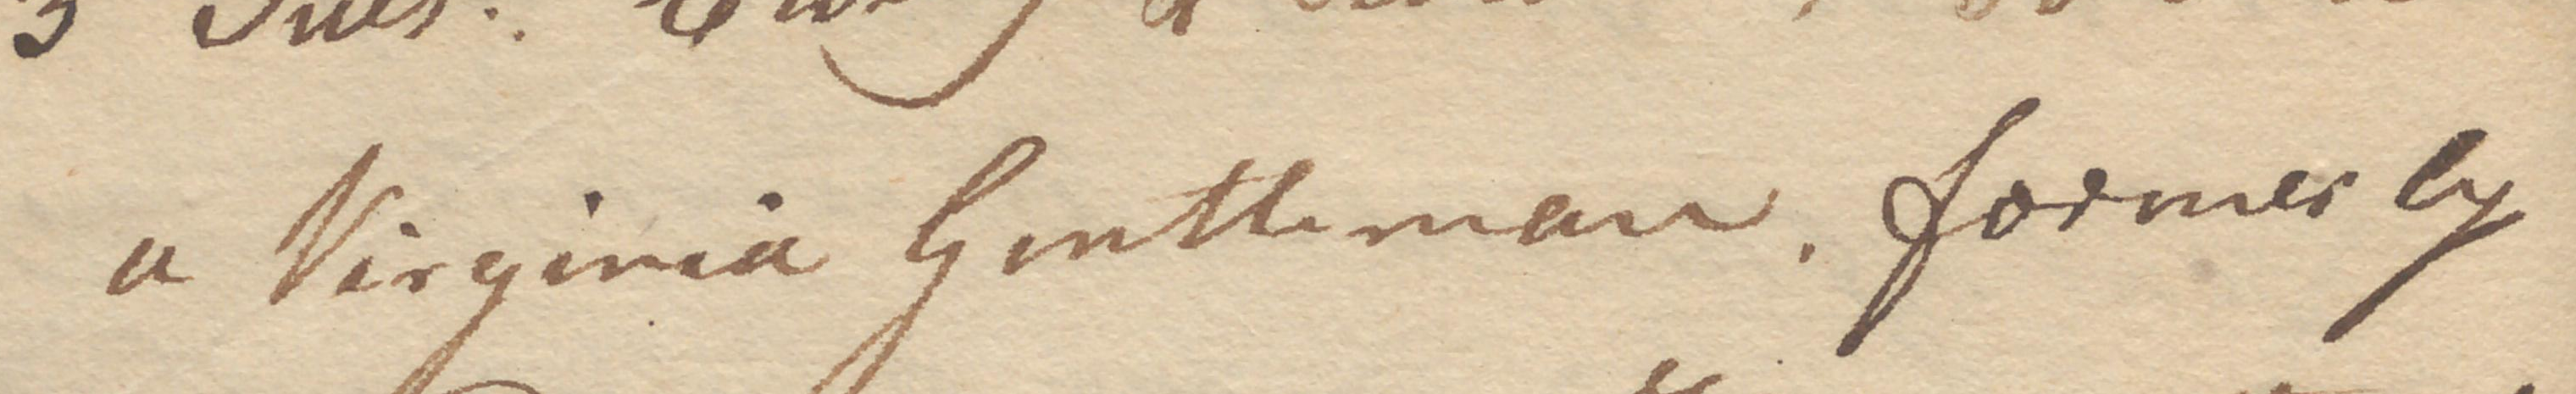a Virginia Gentleman. formerly
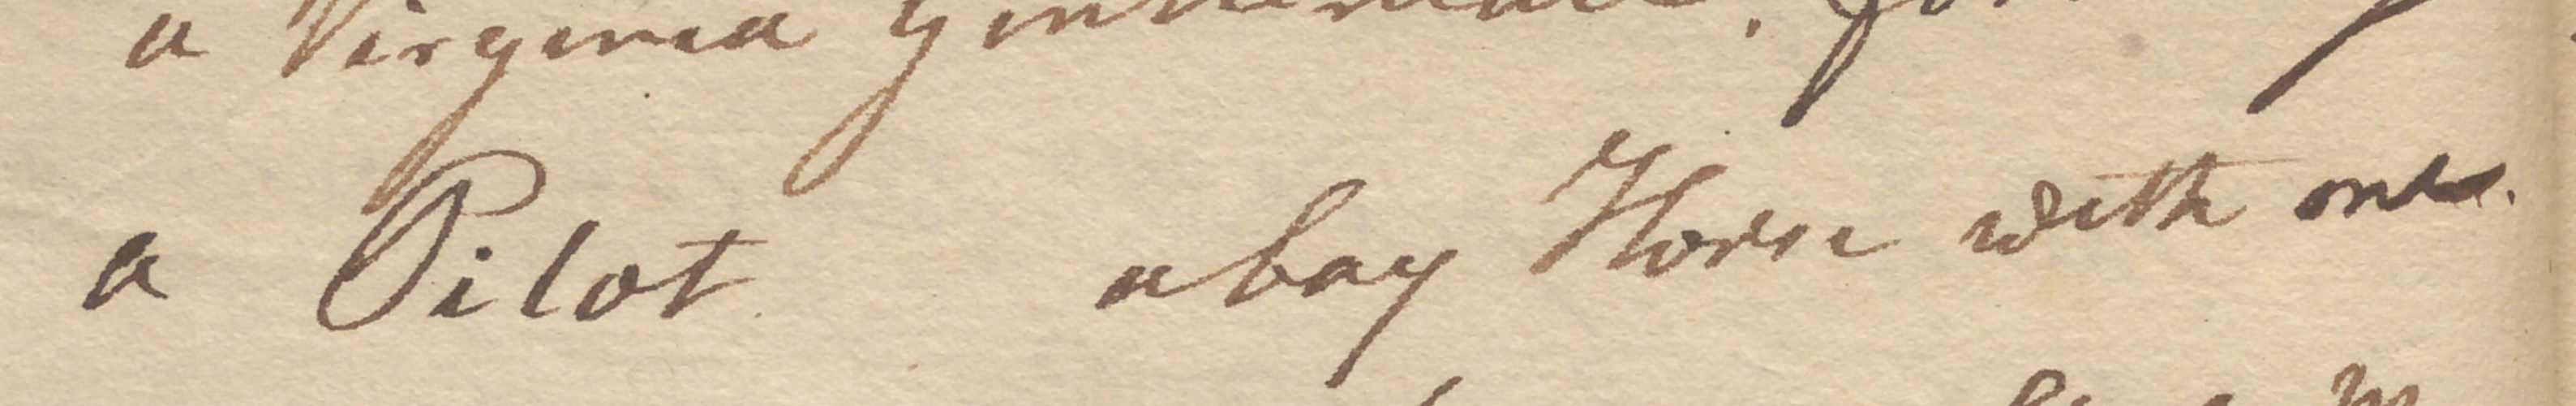a Pilot a bay Horse with one
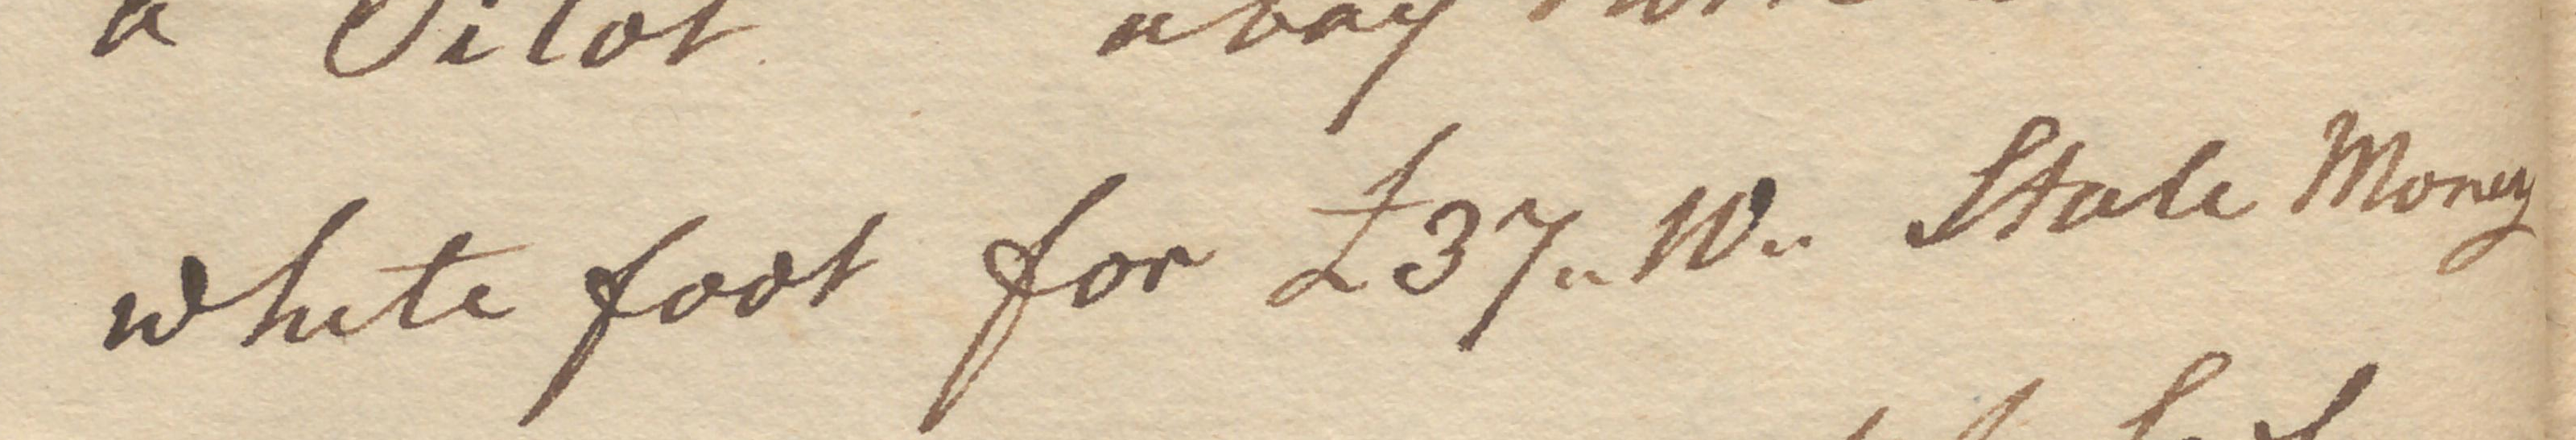white foot for £37. W. State Mons
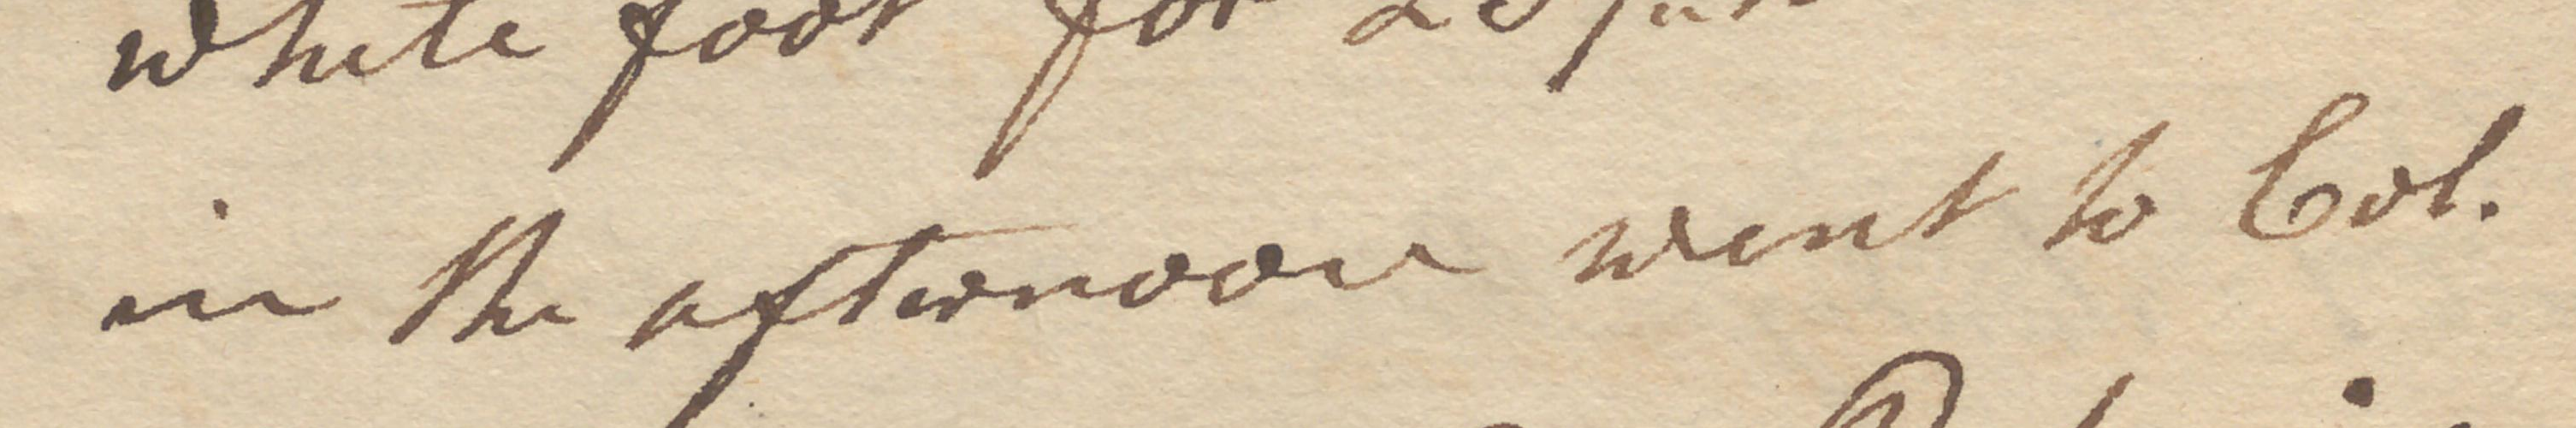in the afternoon went to Col.
